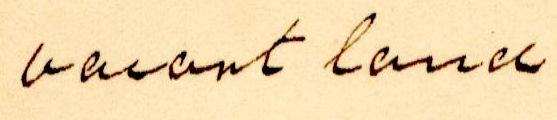vacant Land
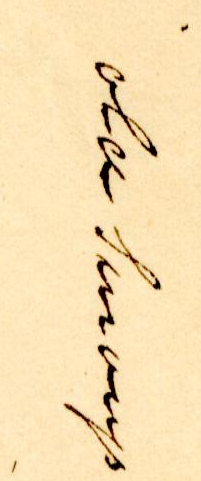old surveys
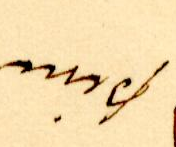pine
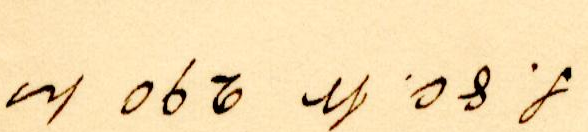S. 80. W 290 ps
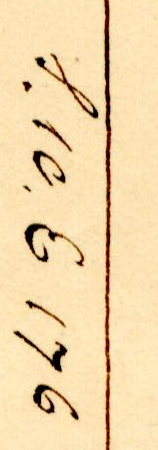S.10. E 176
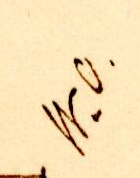W.O.
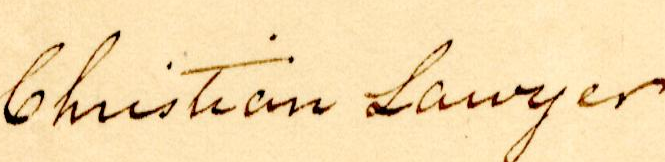Christian Lawyer
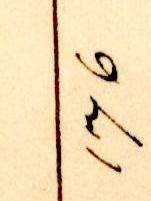176
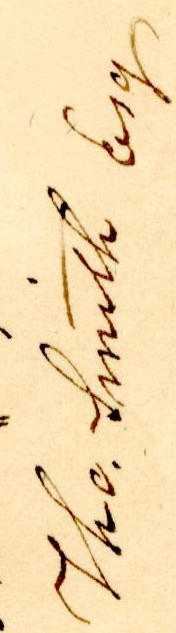Tho. Smith Esq
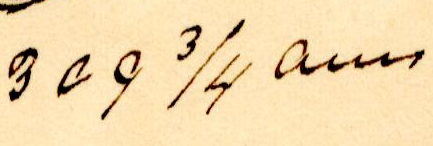309 3/4 acres
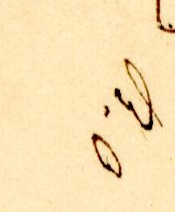B.O
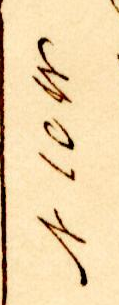N 10 W
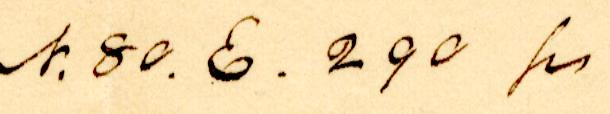N. 80. E. 290 ps
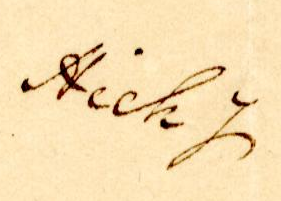Hick Y
